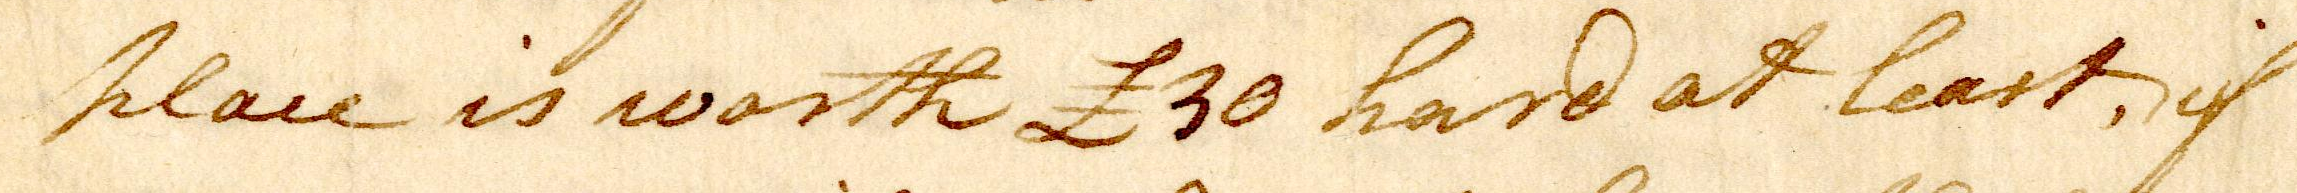place is worth £50 hard at least, if
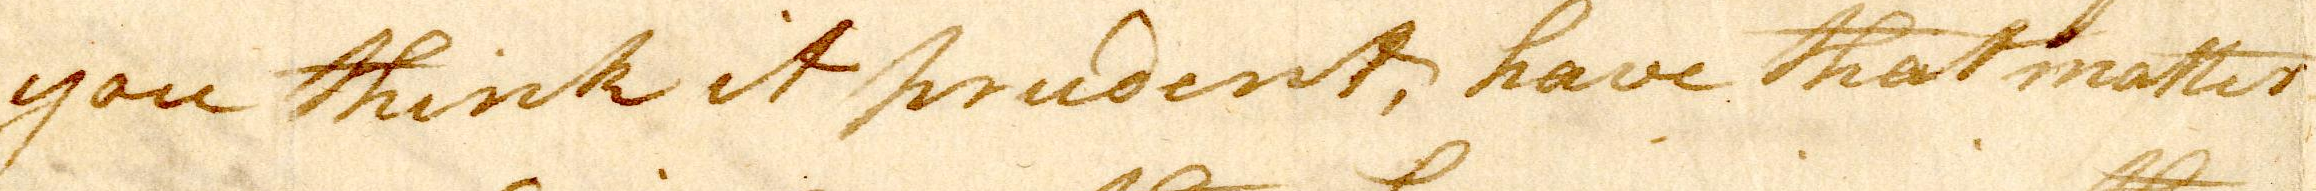you think it prudent, have that matter
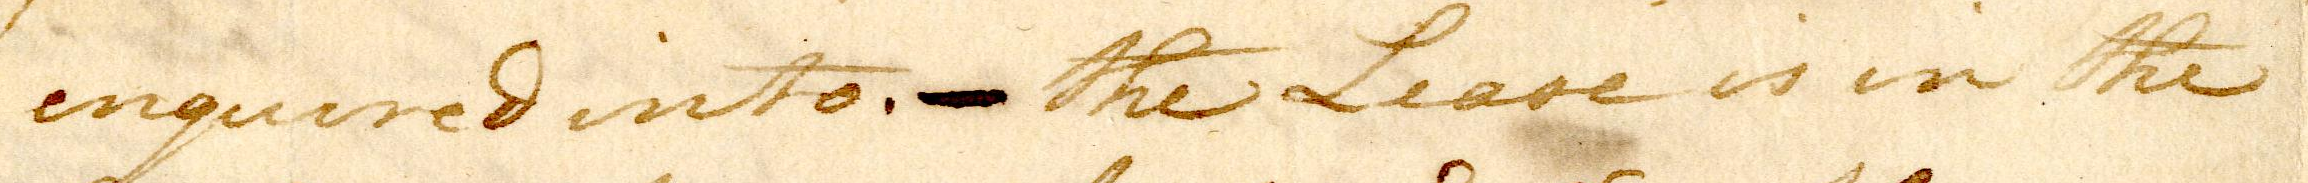enquired into. the Lease is in the
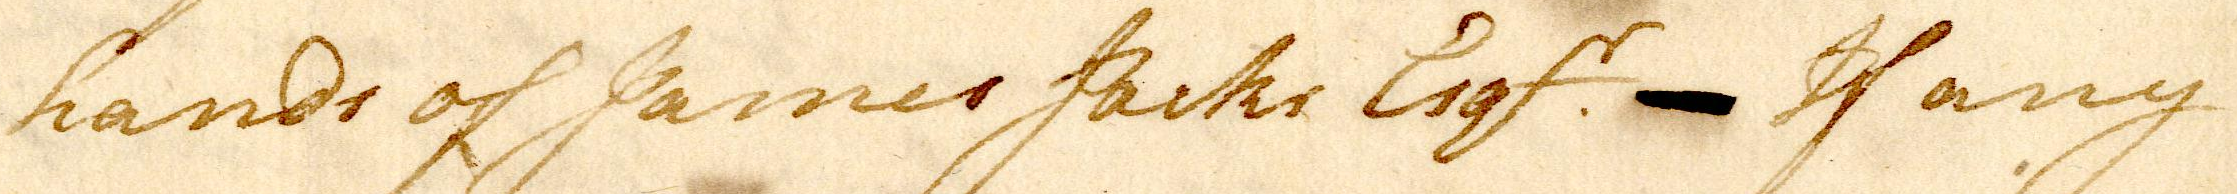hands of James Jacks Esq^r. If any
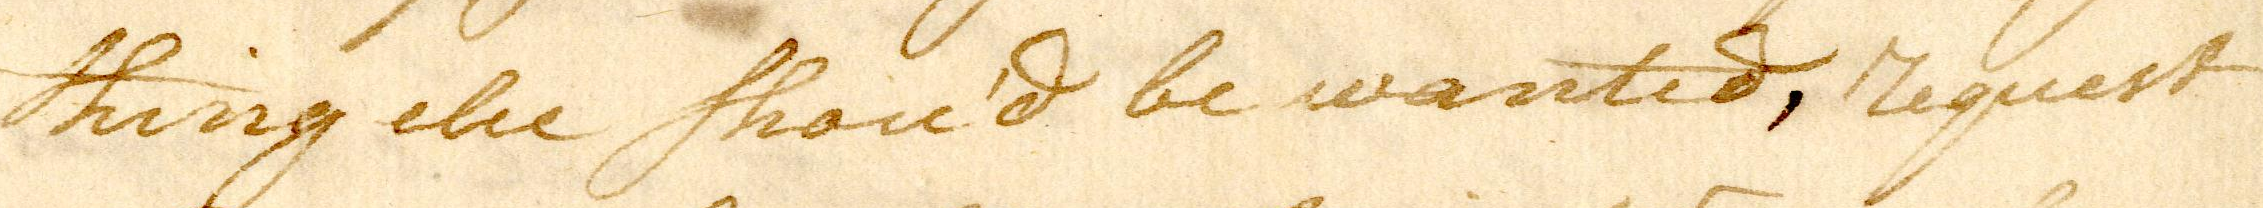thing else shou'd be wanted, request
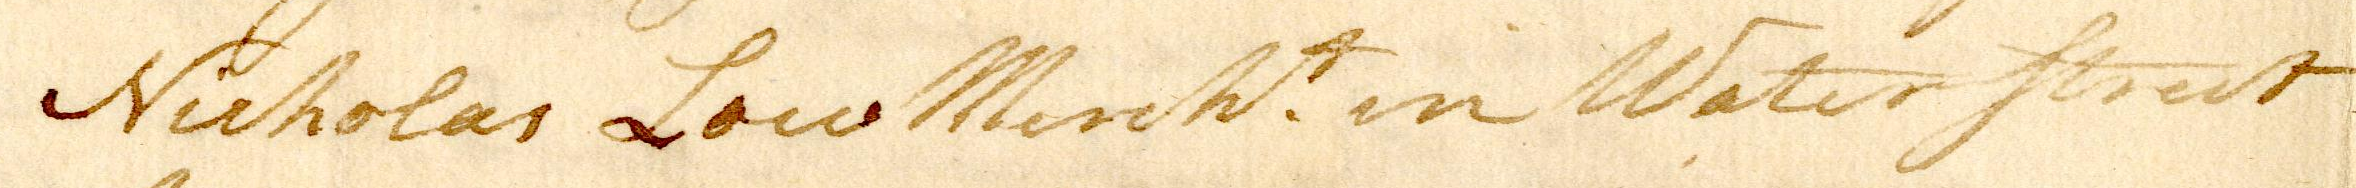Nicholas Low March^t. in Water Street
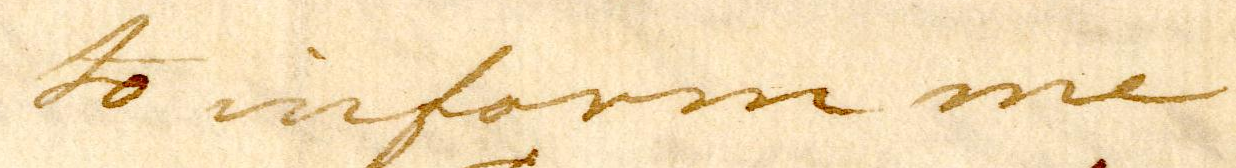to inform me
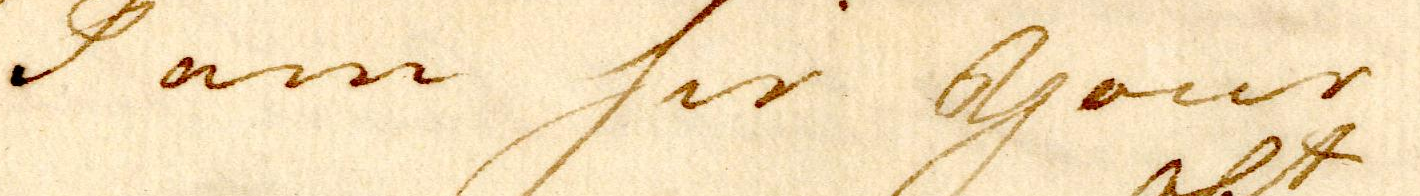I am Sir Your
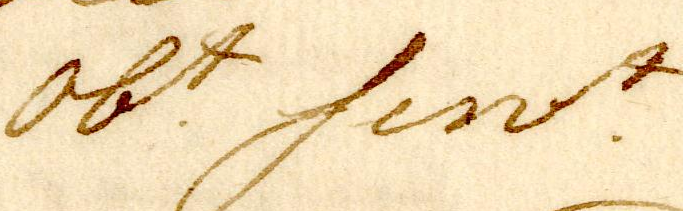ob^t Serv^t
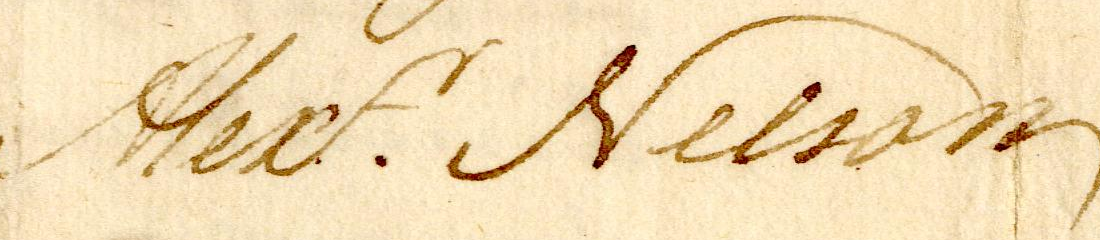Alex^r Nelson
